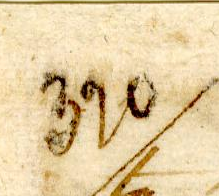320
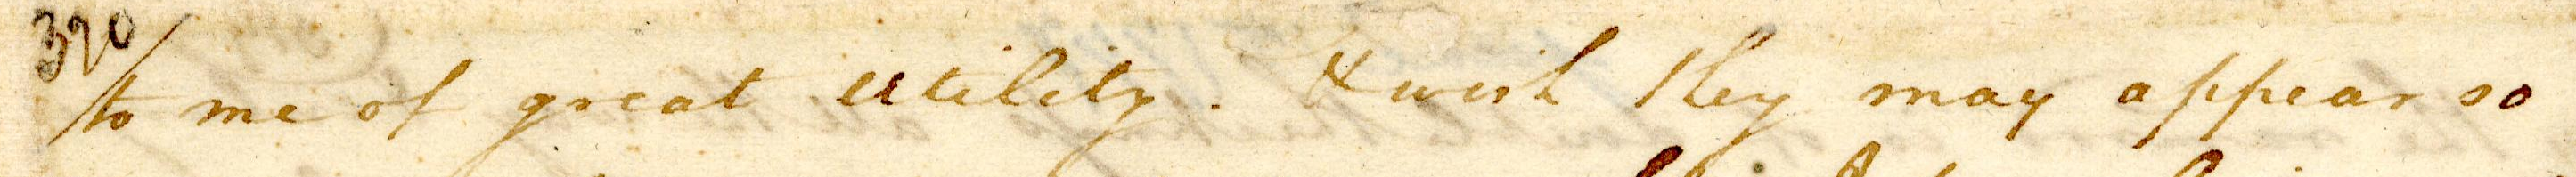to me of great Utility. & wish they may appear so
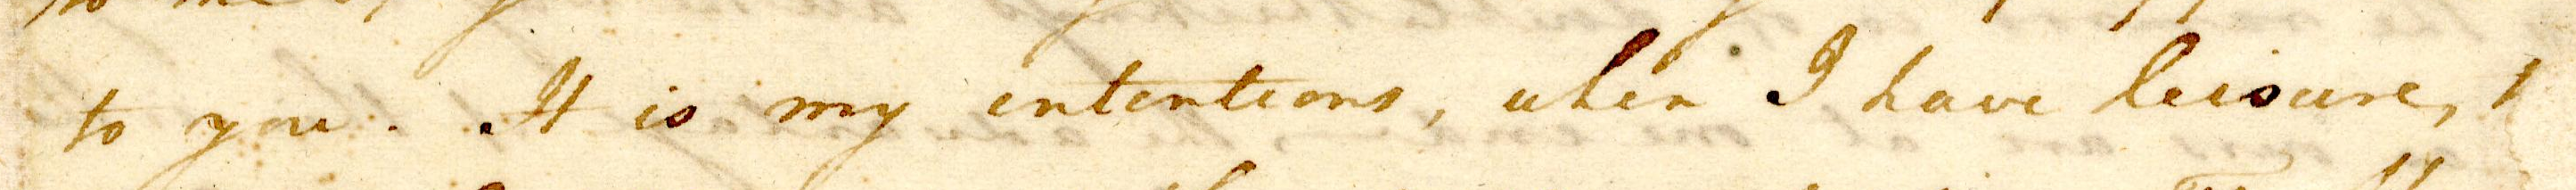to you It is my intentions, when I have leisure, I
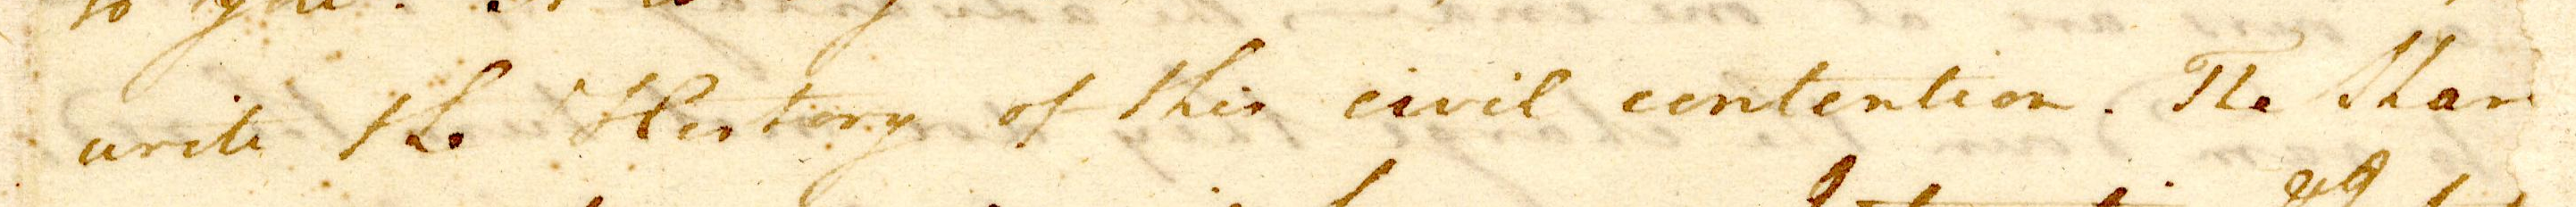write the History of this civil contention. The Share
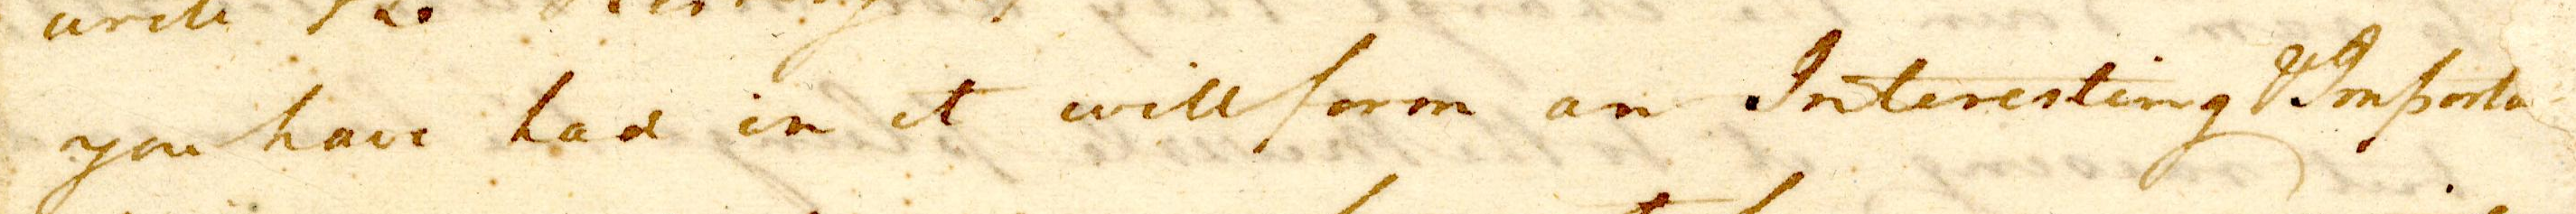you have had in it will form an Interesting & Important
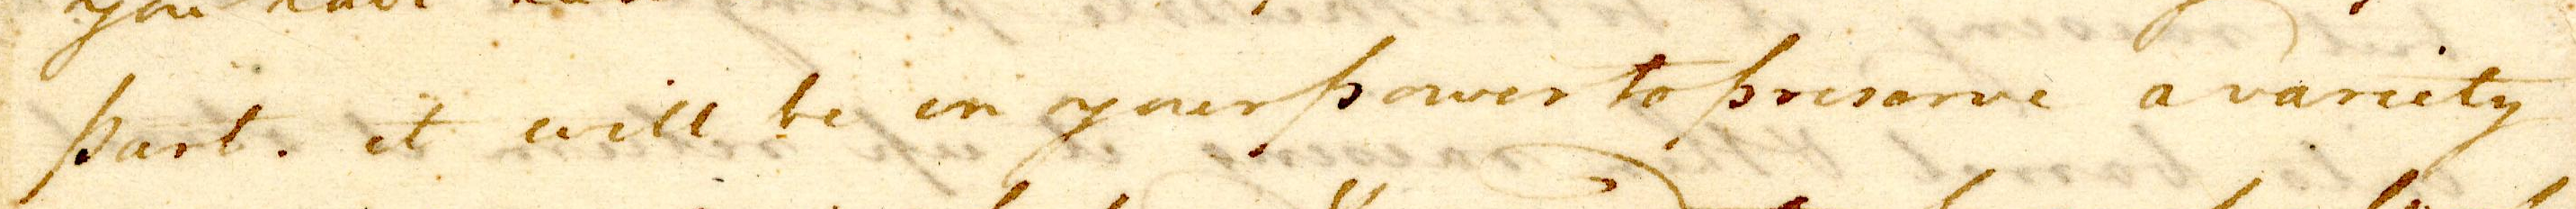part it will be in your power to preserve a variety
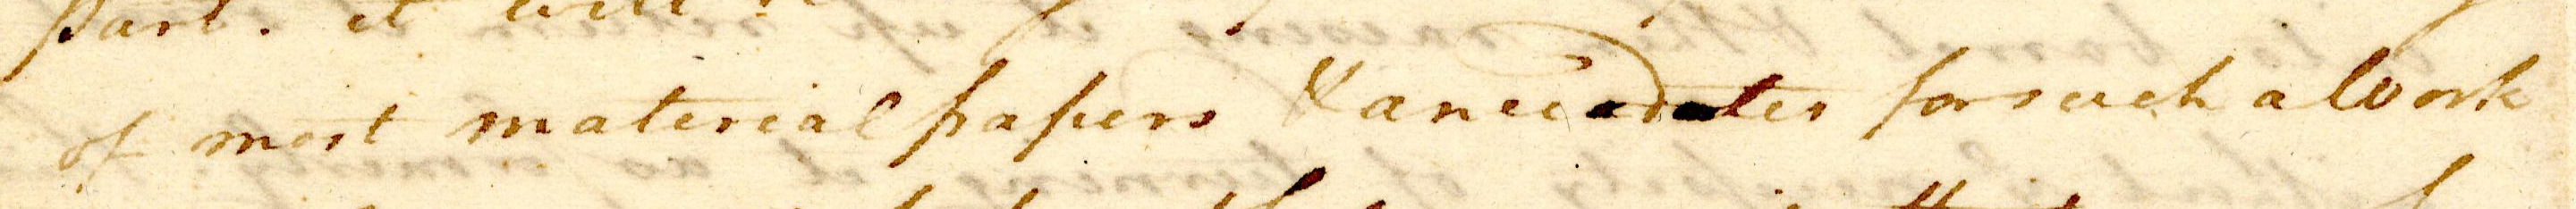of most material papers & anecdotes for such a work
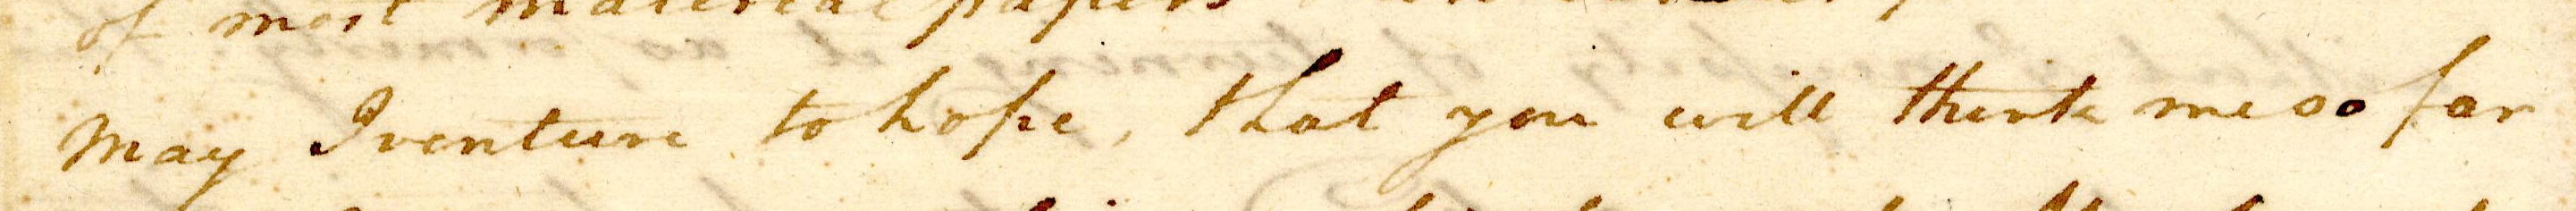may I venture to hope, that you will think me so far
